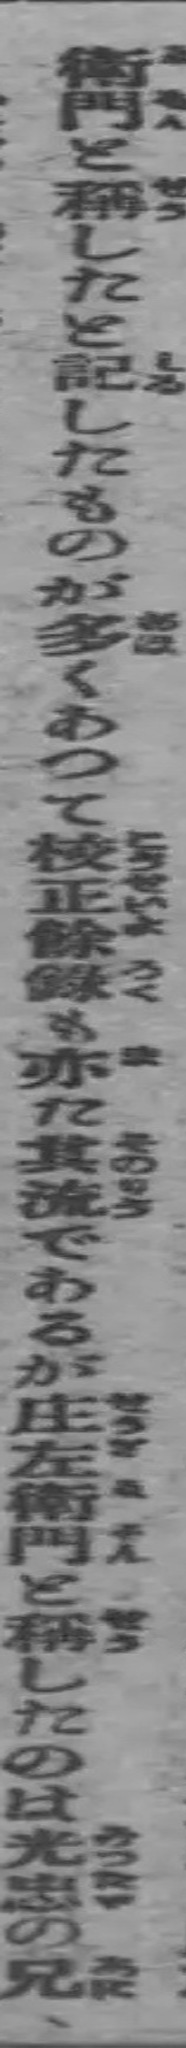衛門と称したと記したものが多くあつて校正余録も亦た其流であるが庄左衛門と称したのは光忠の兄
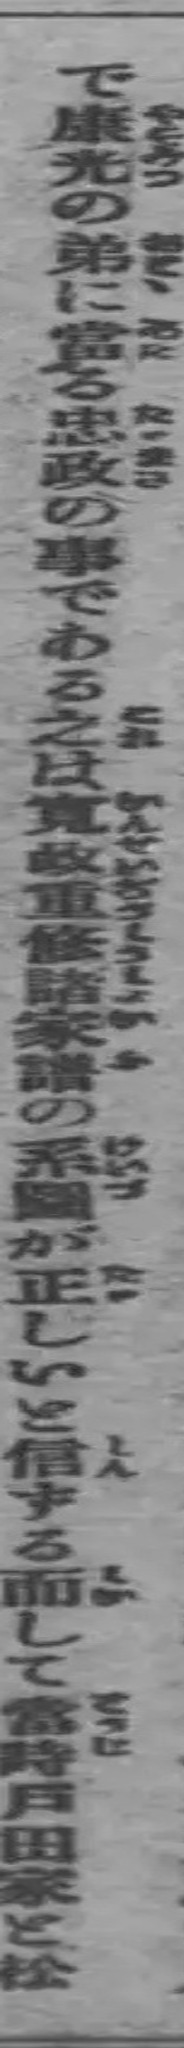で康光の弟に当る忠政の事である之は寛政重修諸家譜の系図が正しいと信ずる而して当時戸田家と松
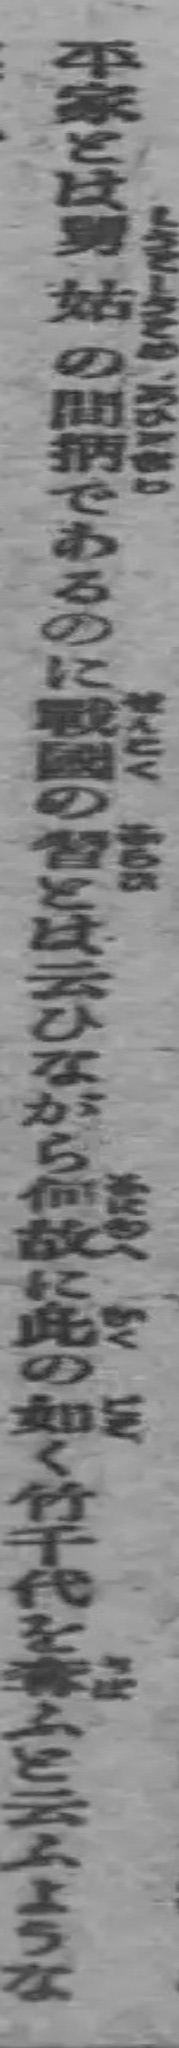平家とは舅姑の間抦であるのに戦国の習とは云ひながら何故に此の如く竹千代を奪ふと云ふような
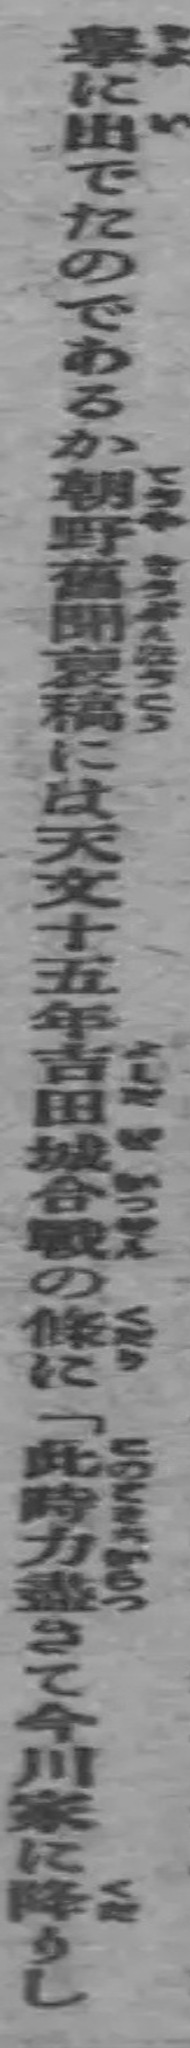挙に出でたのであるか朝野旧聞裒稿には天文十五年吉田城合戦の条に「此時力盡きて今川家に降りし
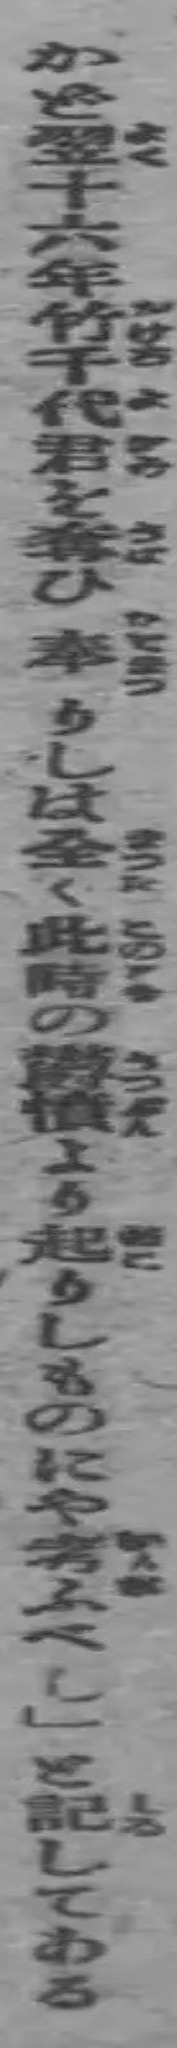かど翌十六年竹千代君を奪ひ奉りしは全く此時の鬱憤より起りしものにや考ふべし」と記してある
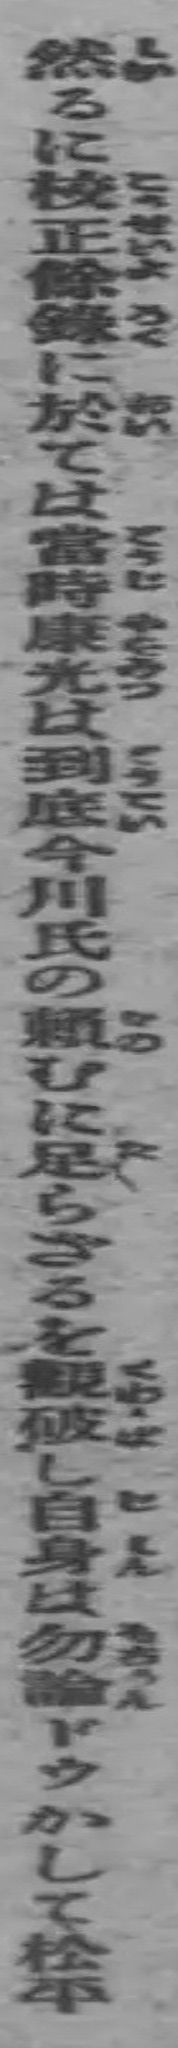然るに校正余録に於ては当時康光は到底今川氏の頼むに足らざるを観波し自身は勿論ドウかして松平
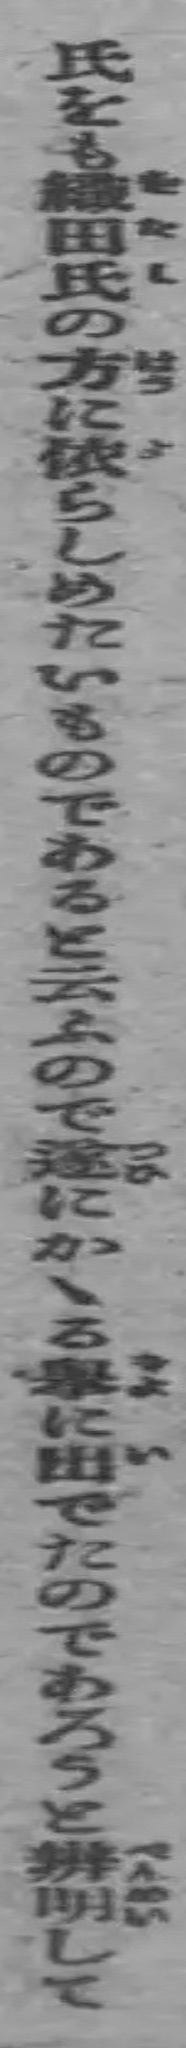氏をも織田氏の方に依らしめたいものであると云ふので遂にかゝる挙に出でたのあろうと弁明して
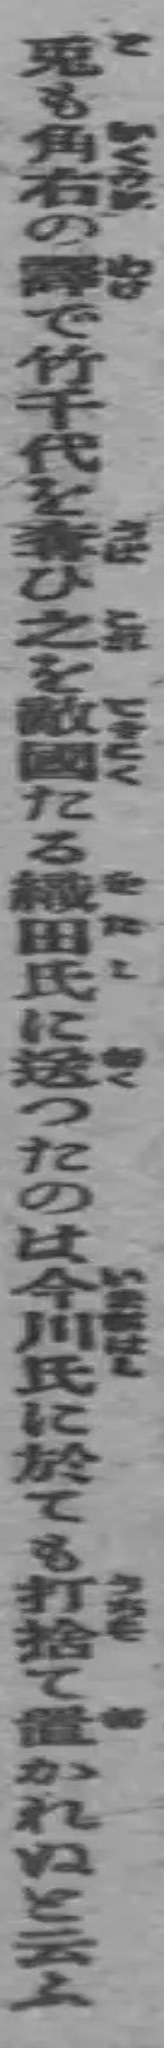兎も角右の訳で竹千代を奪ひ之を敵国たる織田氏に送つたのは今川氏に於ても打捨て置かれぬと云ふ
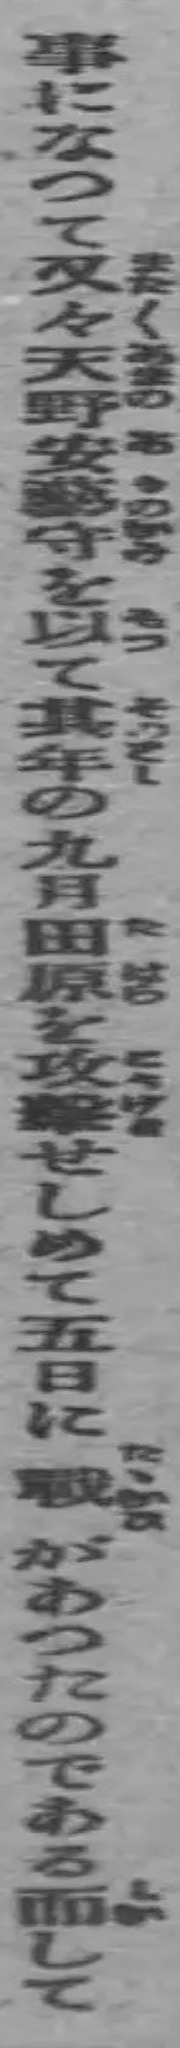田原落城事になつて又々天野安芸守を以て其年の九月田原を攻撃せしめて五日に戦があつたのである而して
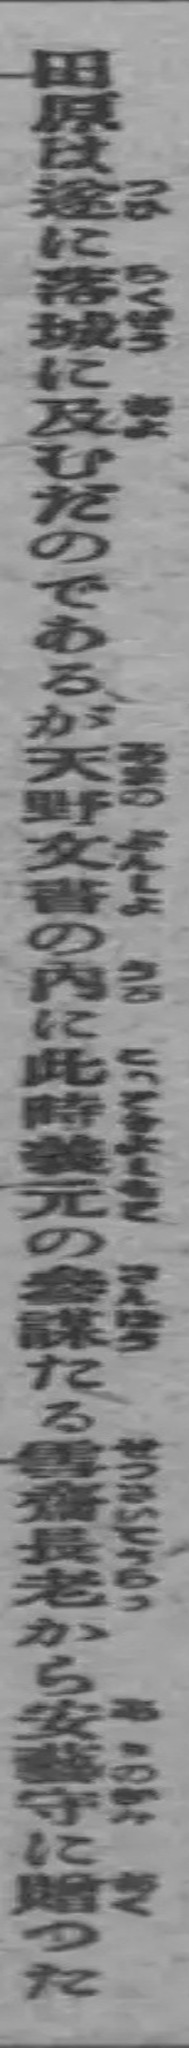田原は遂に落城に及むだのであるが天野文書の内に此時義元の参謀たる雪斎長老から安芸守に贈つた
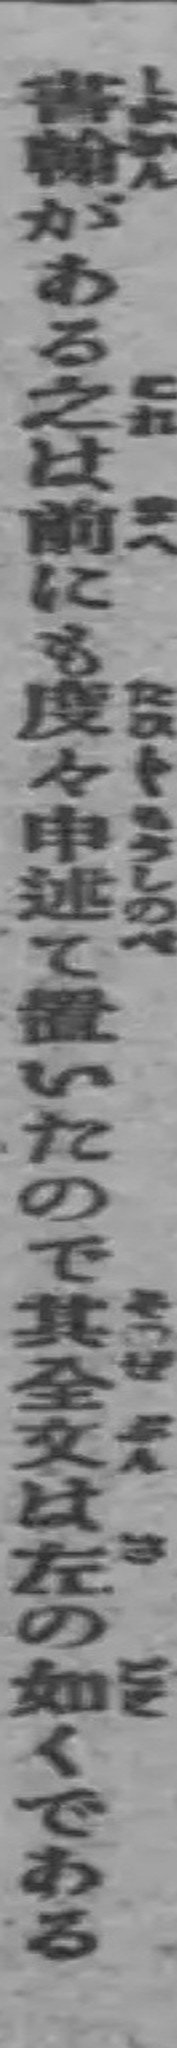書翰がある之は前にも度々申述て置いたので其全文は左の如くである
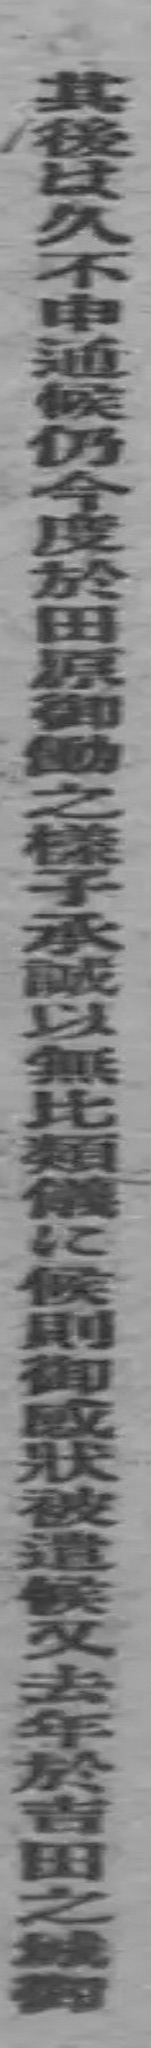其後は久不申通候仍今度於田原御働之様子承誠以無比類儀に候則御感状被遣候又去年於吉田之城御
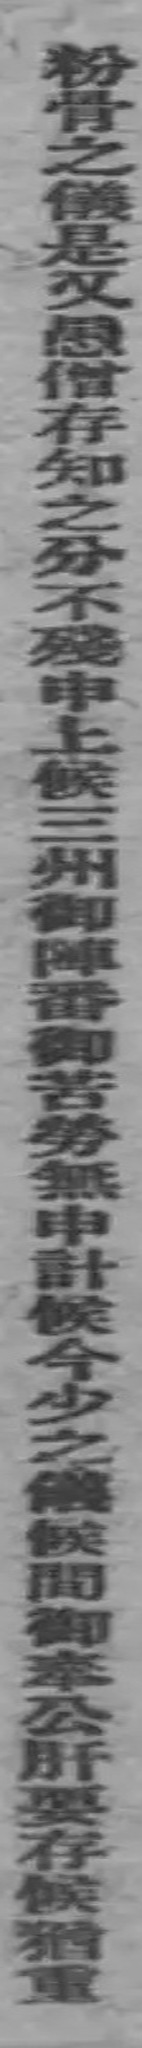粉骨之儀是又愚僧存知之分不残申上候三州御陣番御苦労無申計候今少之儀候間御奉公肝要存候猶重
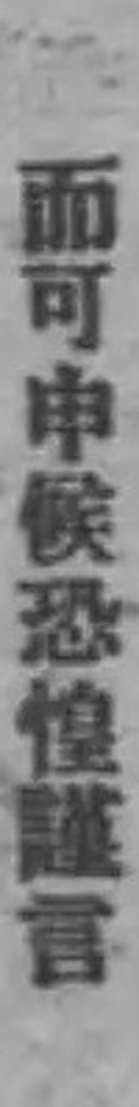而可申候恐惶謹言
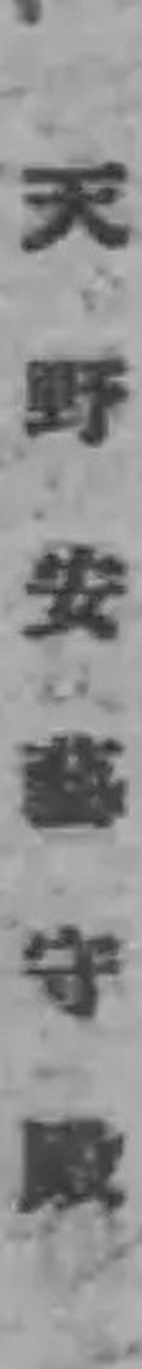天野安芸守殿
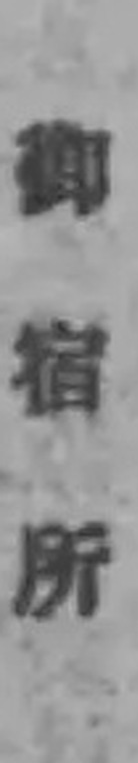御宿所
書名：豊橋市史談
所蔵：国立国会図書館 National Diet Library, JAPAN
